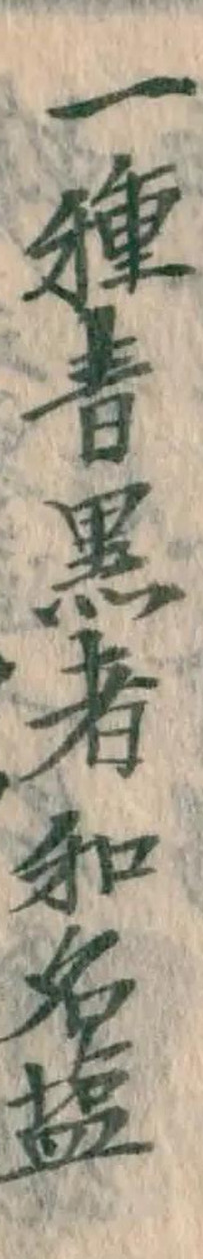一種青黒者和名塩
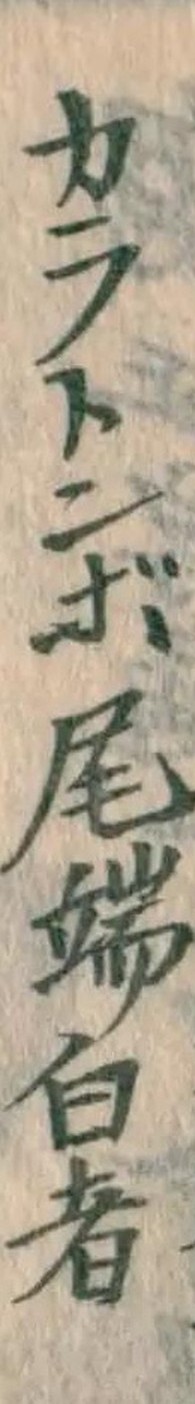カラトンボ尾端白者
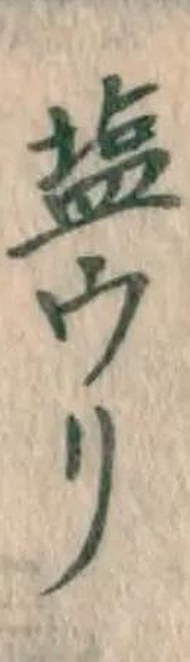塩ウリ

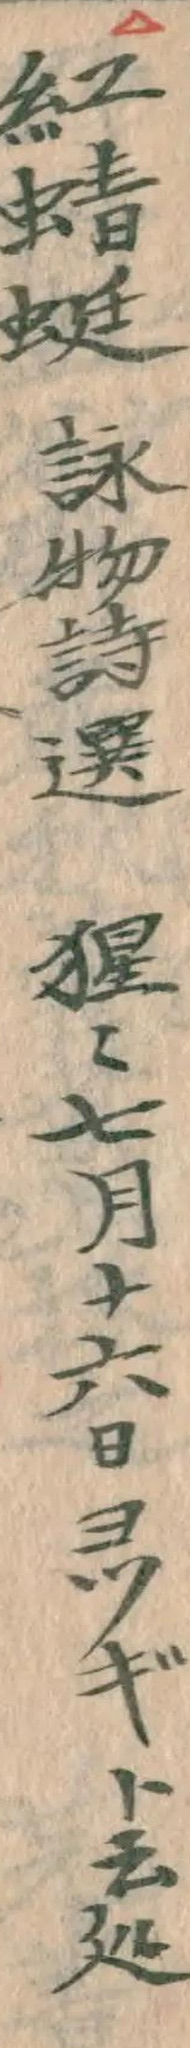紅蜻蜓詠物詩選猩々七月十六日ヨツギト云処
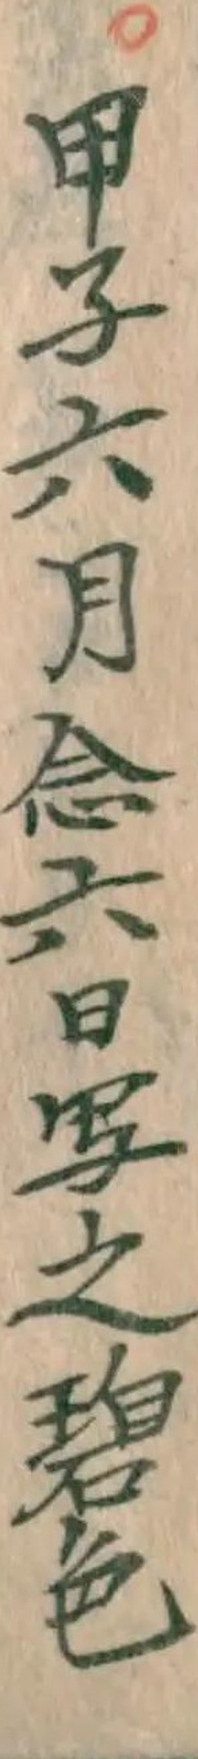甲子六月念六日写之碧色
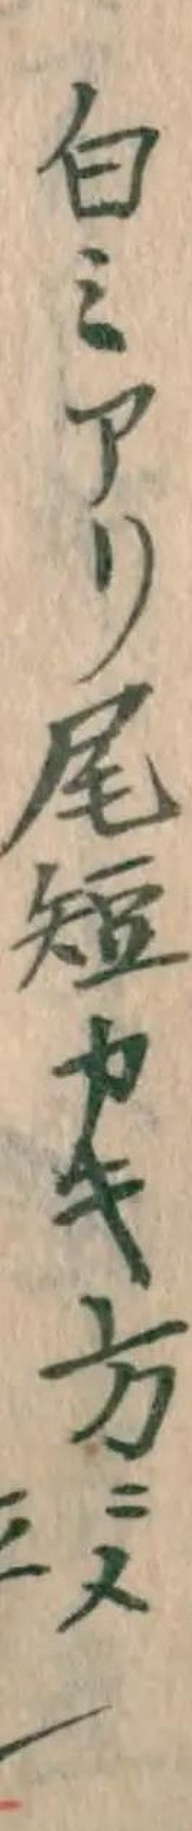白ミアリ尾短カキ方ニシテ
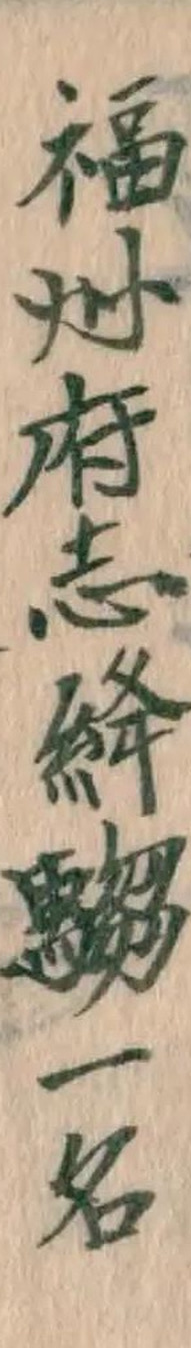福州府志絳騶一名
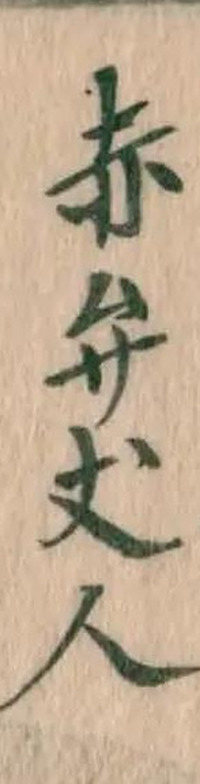赤弁丈人
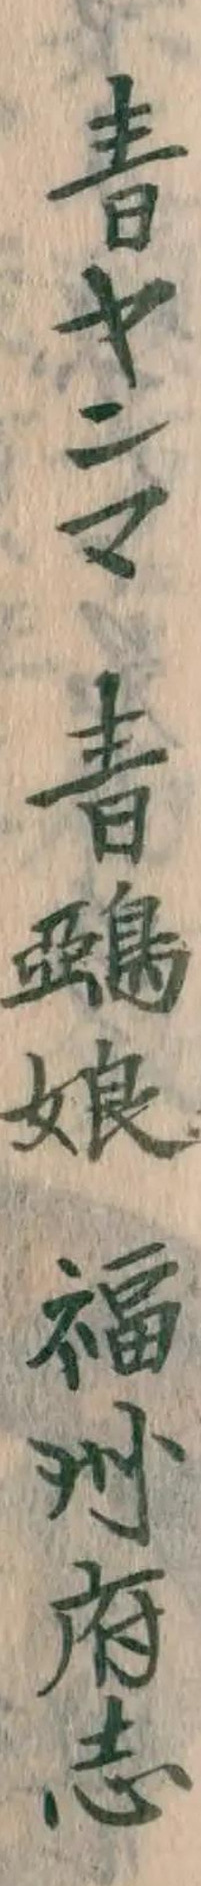青ヤンマ青鵶娘福州府志

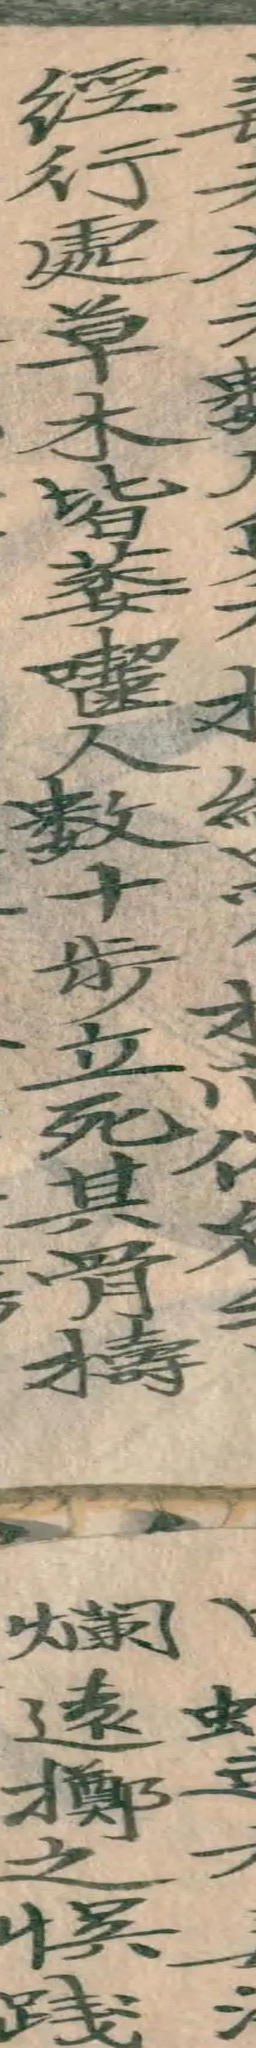経行處草木皆萎囓人数十歩立死其骨檮爛遠擲之悞践
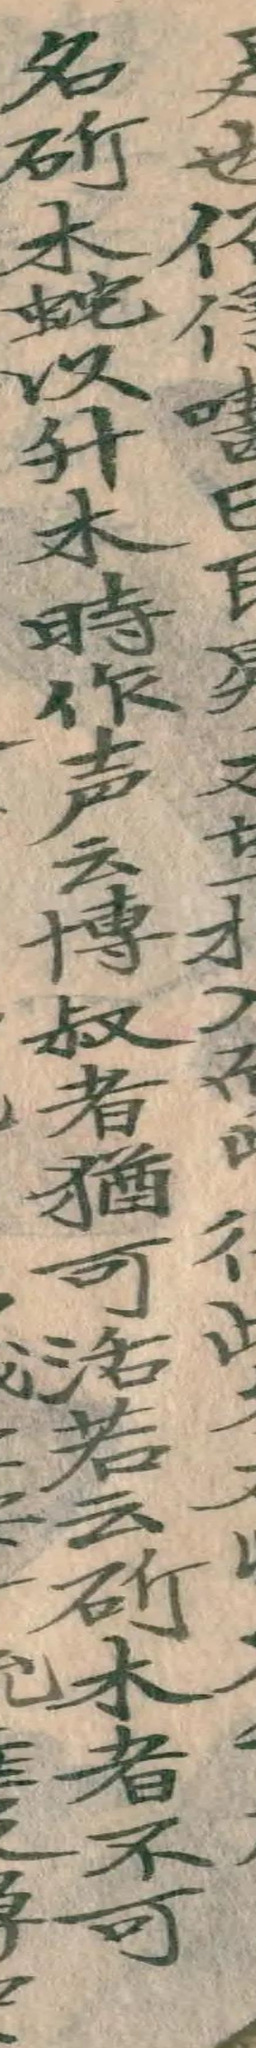名斫木蛇以升木時作声云博叔者猶可活若云斫木者不可救也今
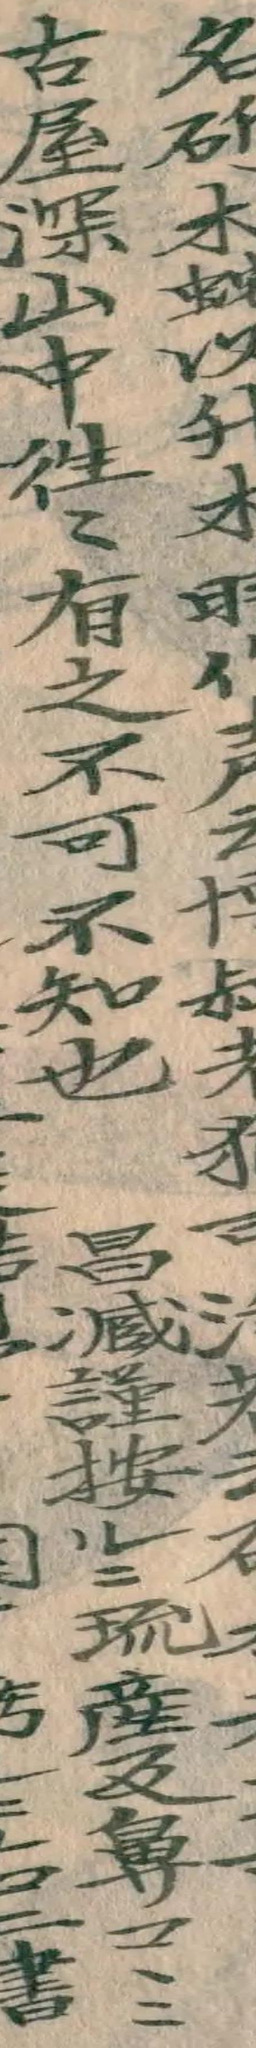古屋深山中往々有之不可不知也昌蔵謹按ルニ琉産反鼻コヽニ図載ス
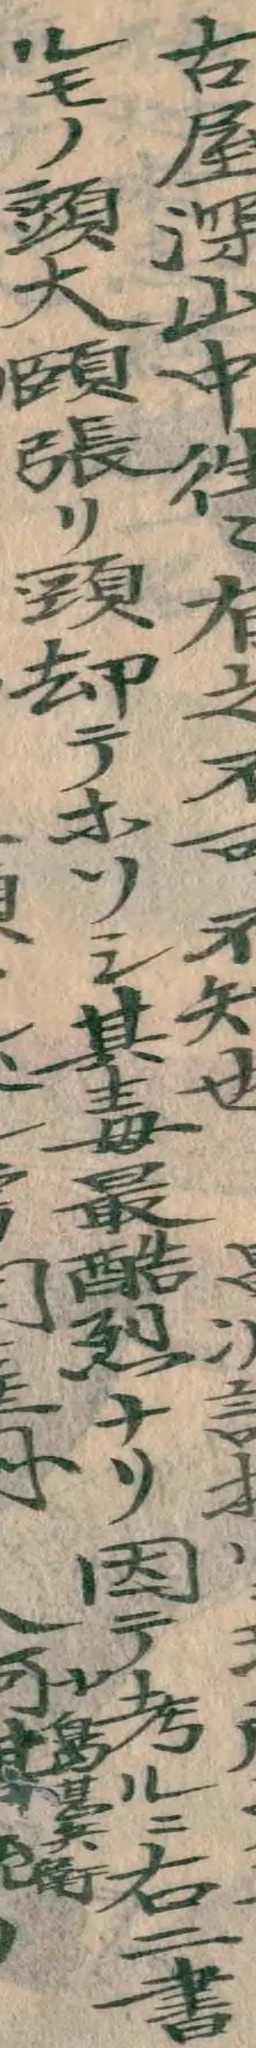ルモノ頭大頤張リ頸却テホソシ其毒最酷烈ナリ因テ考ルニ右ニ書ニ所謂
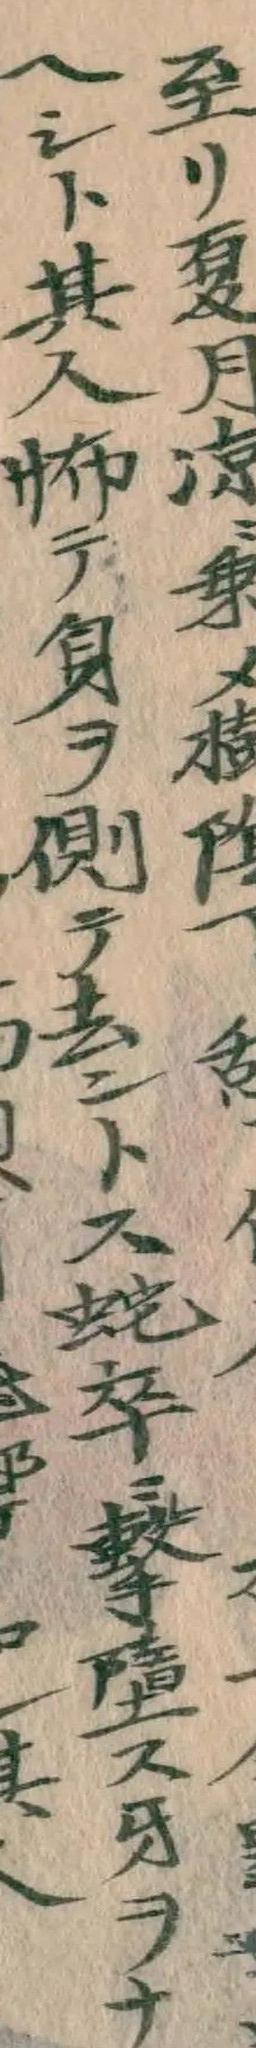ヘシト其人怖テ身ヲ側テ去ントス蛇卒ニ撃堕ス牙ヲナラシ鼻孔
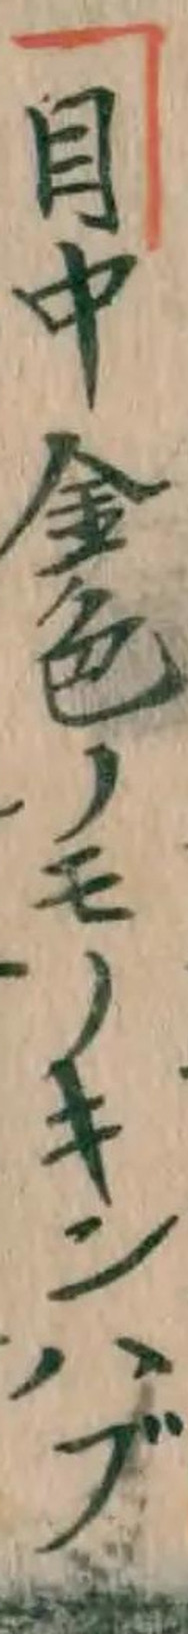「目中金色ノモノキンハブ
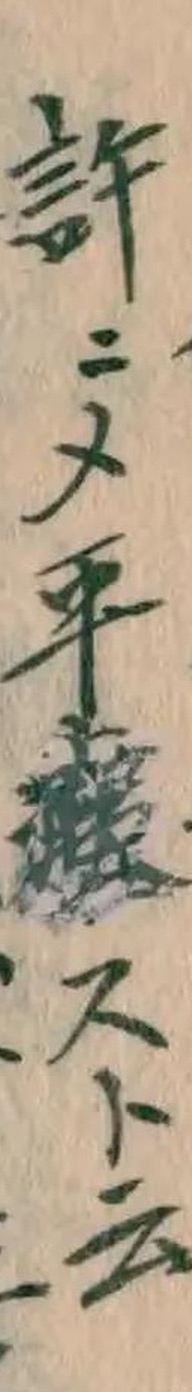許ニシテ平スト云
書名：千蟲譜 3巻. [3]
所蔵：国立国会図書館 National Diet Library, JAPAN
